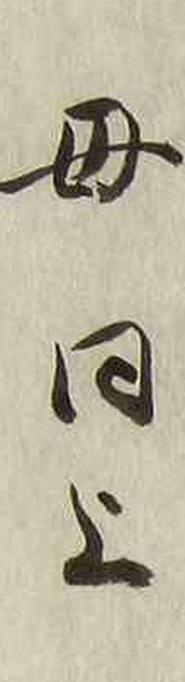母同上

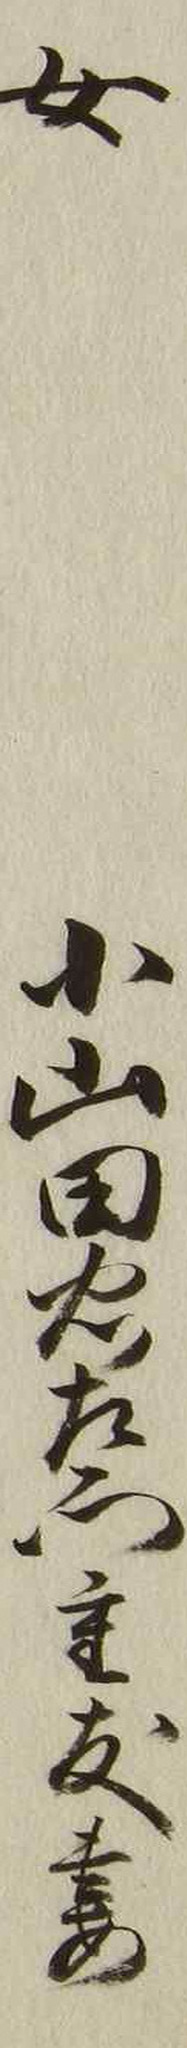女小山田忠左門重友妻
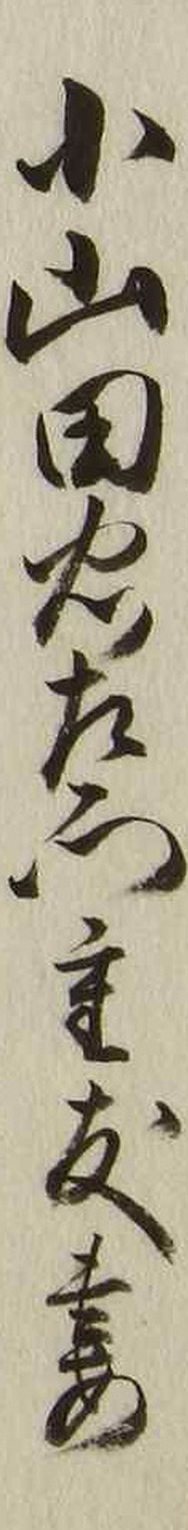女小山田忠左門重友妻
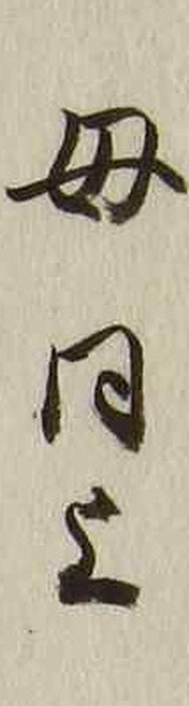母同上
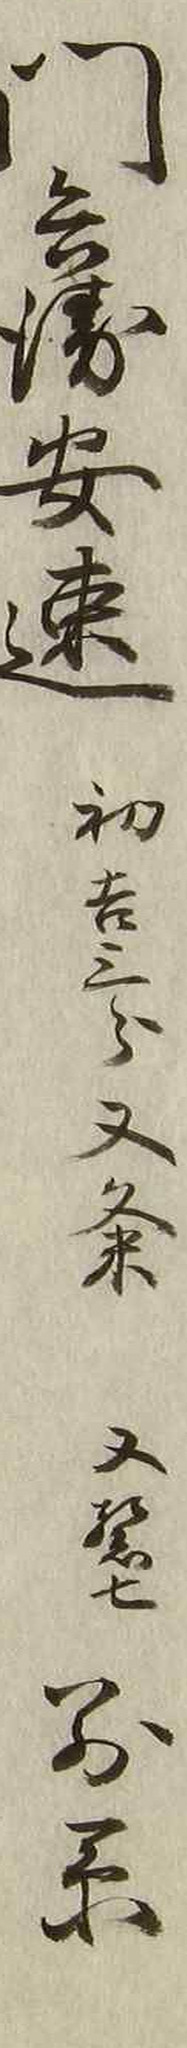門兵衛安速初吉三郎又粂又繁七別系
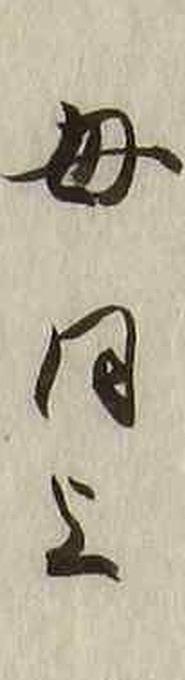母同上
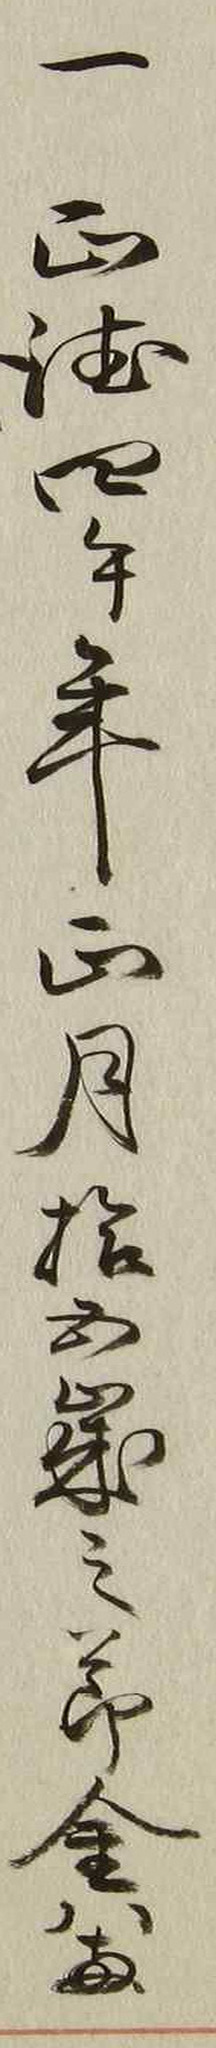一正徳四午年正月拾五歳之節金八両
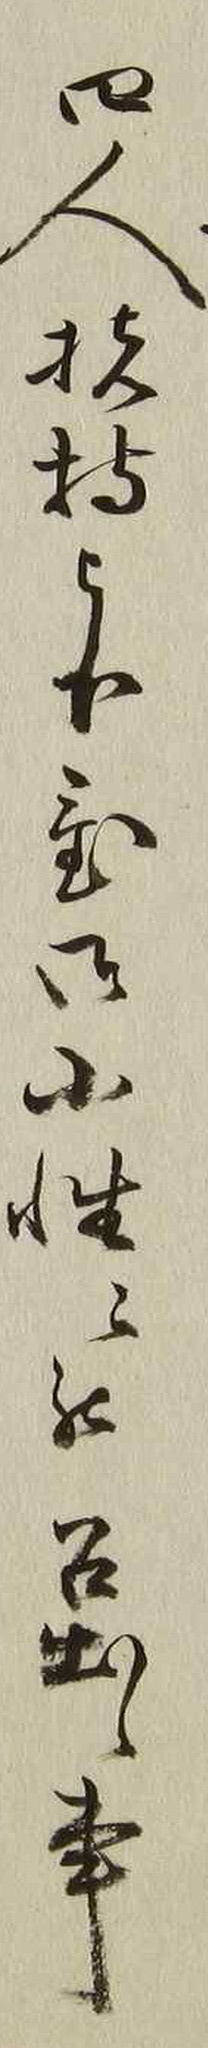四人扶持被下置御小性ニ被召出候事
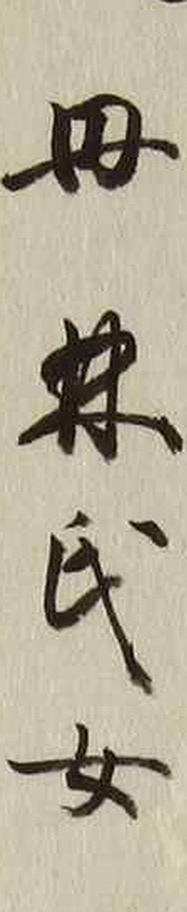母林氏女
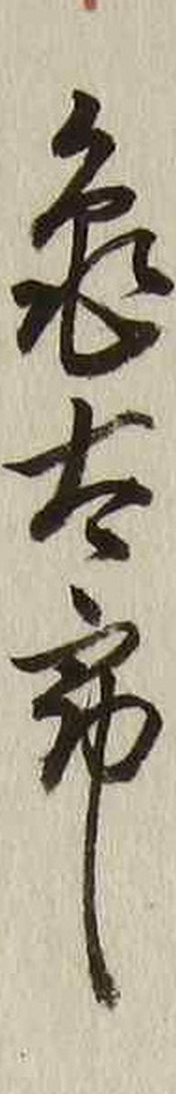亀太郎
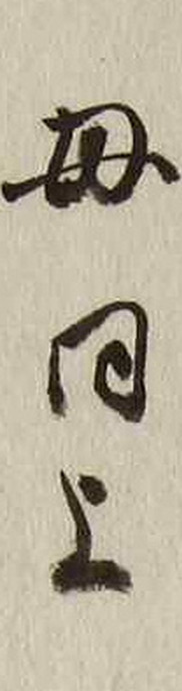母同上
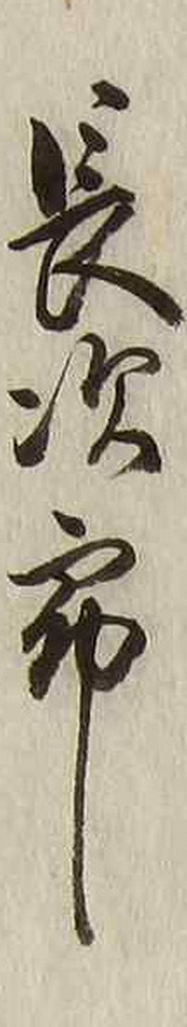長次郎
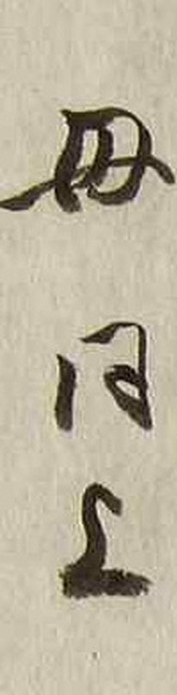母同上
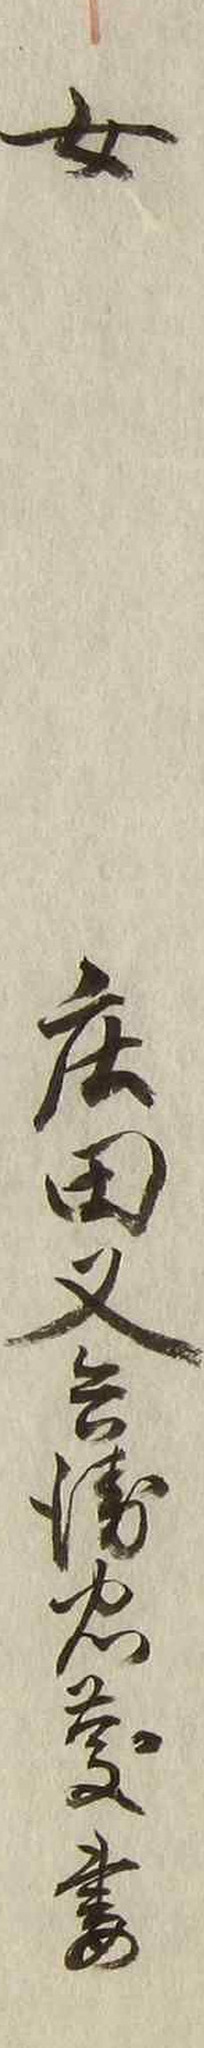女庄田又兵衛忠慶妻
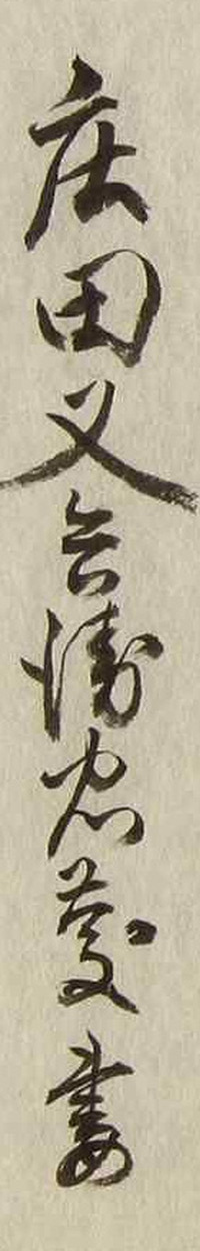女庄田又兵衛忠慶妻

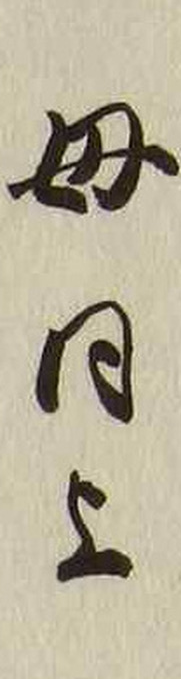母同上
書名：諸士系譜　巻之15　い之部15
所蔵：会津若松市立会津図書館
